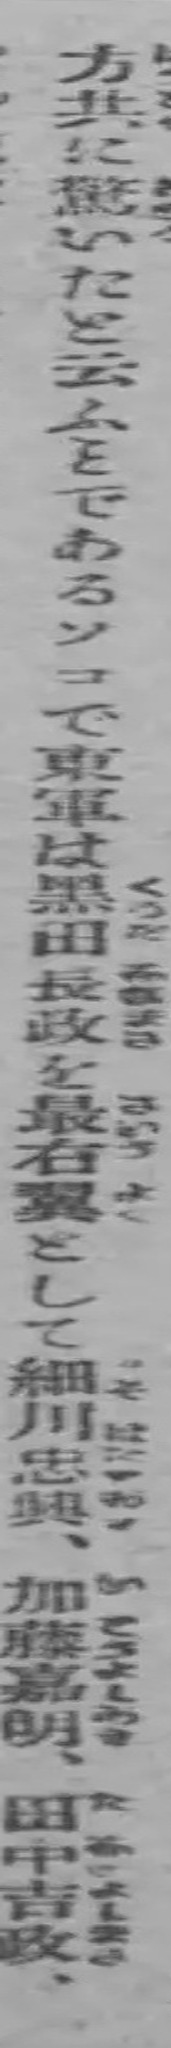方共に驚いたといふことであるソコで東軍は黒田長政を最右翼として細川忠興、加藤嘉明、田中吉政、
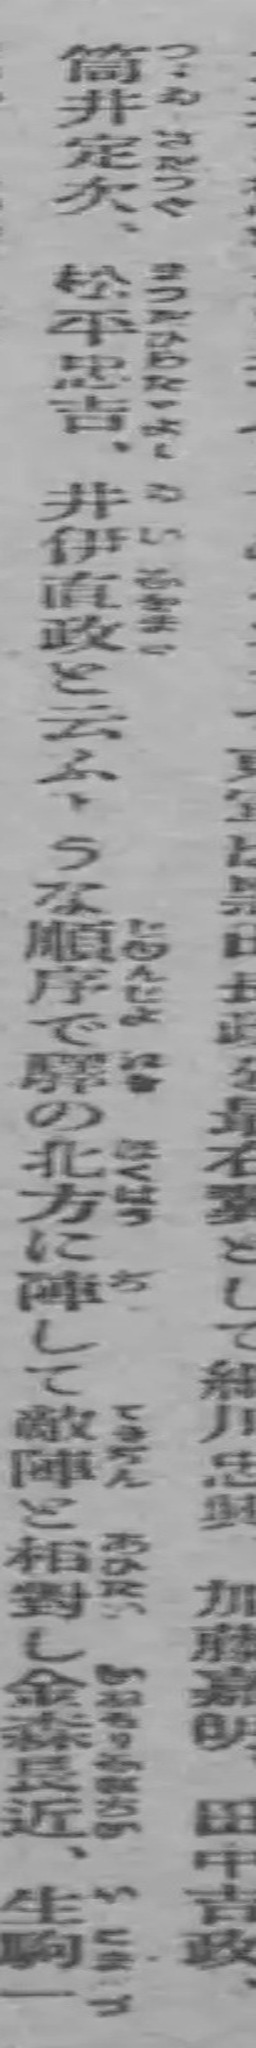筒井定次、松平忠吉、井伊直正と云ふような順序で駅の北方に陣して敵陣と相対し金森長近、生駒一
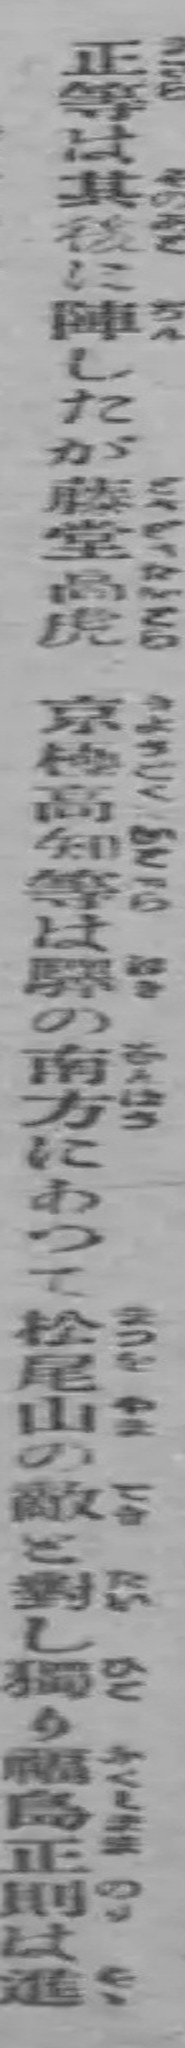正等は其後に陣したが藤堂高虎、京極高知等は駅の南方にあつて松尾山の敵と対し独り福島正則は進
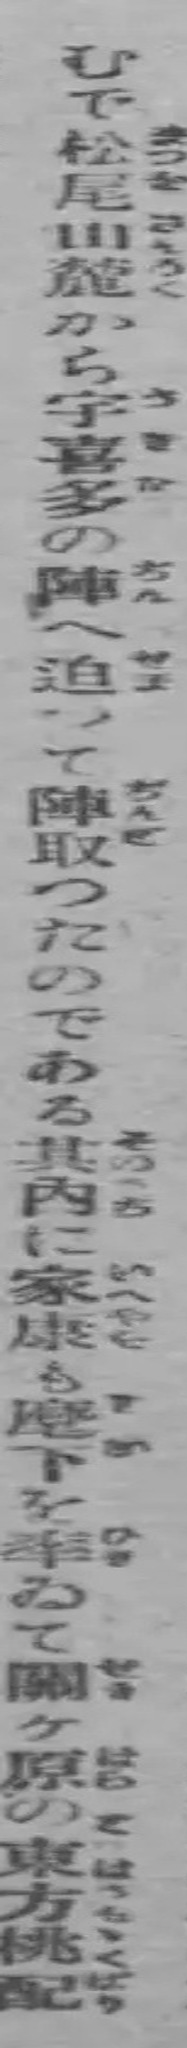桃配山むで松尾山麓から宇喜多の陣へ迫つて陣取つたのである其内に家康も麾下を率ゐて関ヶ原の東方桃配
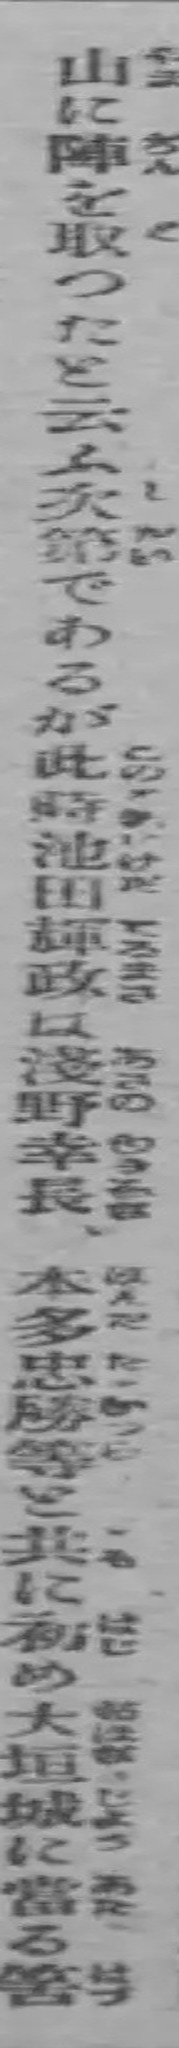山に陣を取つたと云ふ次第であるが此時池田輝政は浅野幸長、本多忠勝等と共に初め大垣城に当る筈
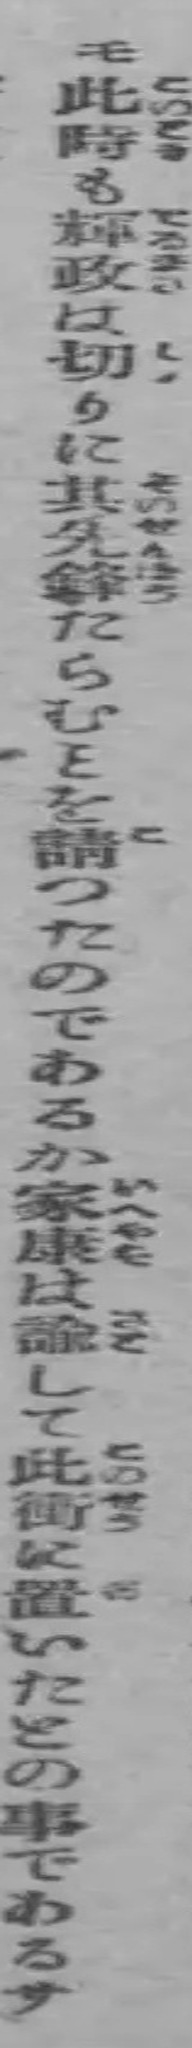モ此時も輝政は切りに其先鋒たらむことを請つたのであるか家康は諭して此衝に置いたとの事であるサ
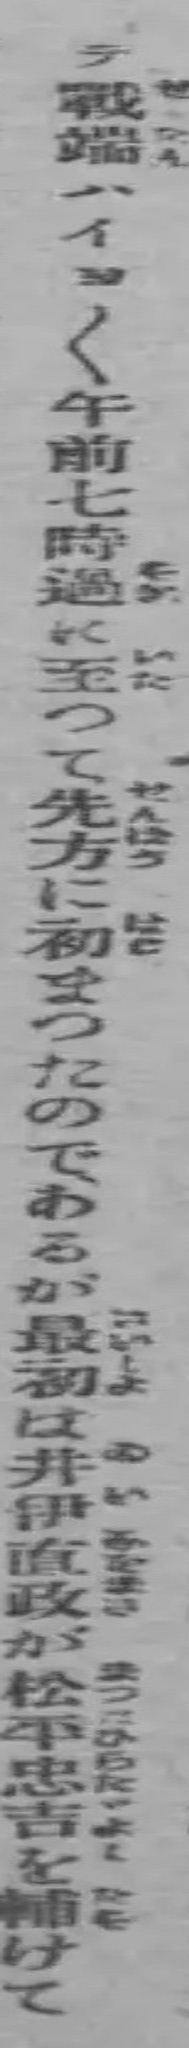テ戦端ハイヨ〳〵午前七時過に至つて先方に初まつたのであるが最初は井伊直政が松平忠吉を輔けて
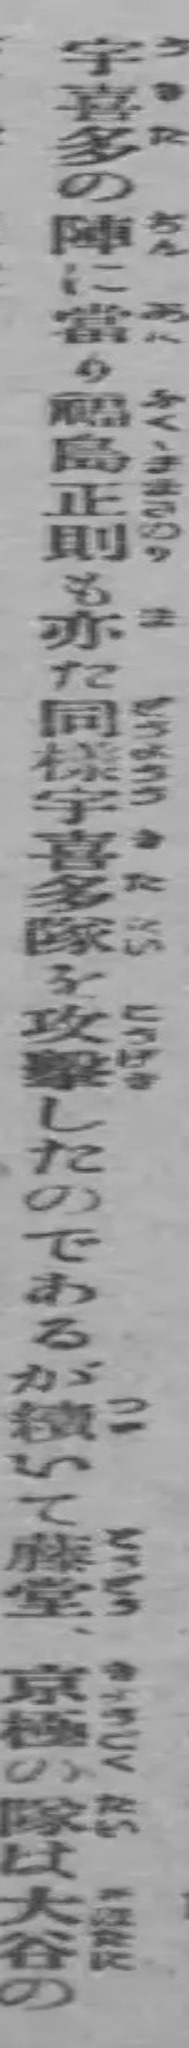宇喜多の陣に当り福島正則も亦た同様宇喜多隊を攻撃したのであるが続いて藤堂、京極の隊は大谷の
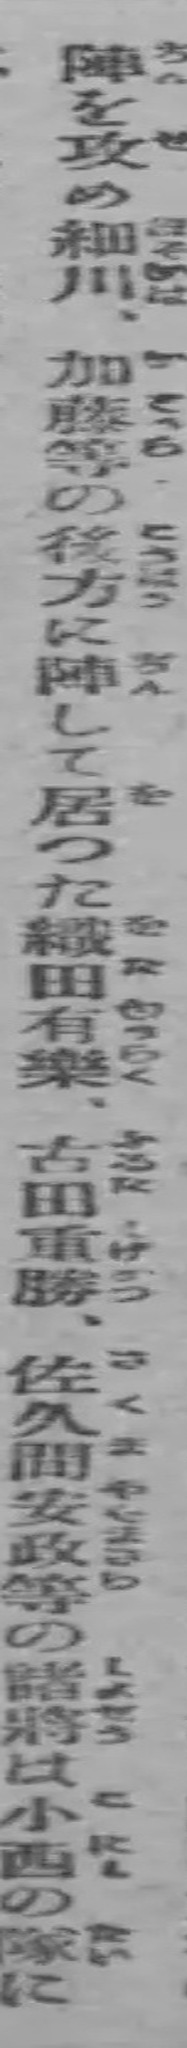陣を攻め細川、加藤等の後方に陣して居つた織田有楽、古田重勝、佐久間安政等の諸将は小西の隊に
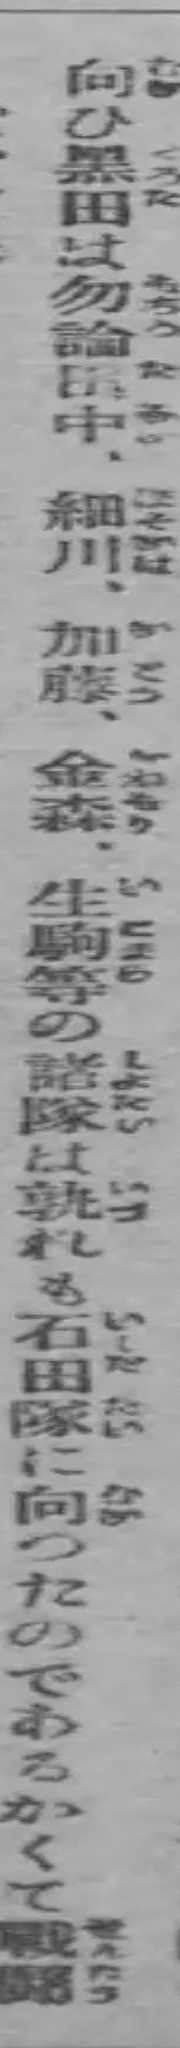向ひ黒田は勿論田中、細川、加藤、金森、生駒等の諸隊は孰れも石田隊に向つたのであるかくて戦闘
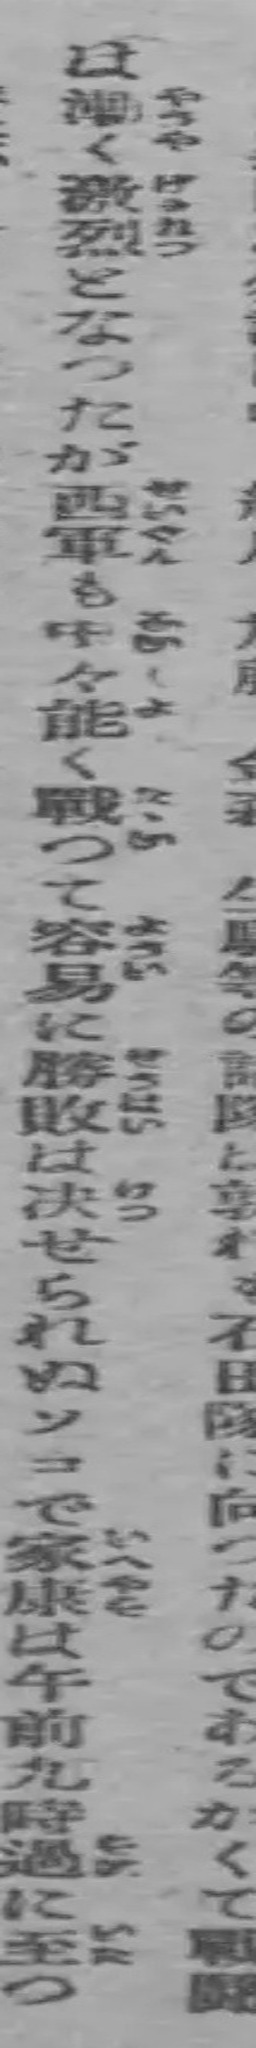両軍の決戦は漸く激烈となつたが西軍も中々能く戦つて容易に勝敗は決せられぬソコで家康は午前九時過に至つ
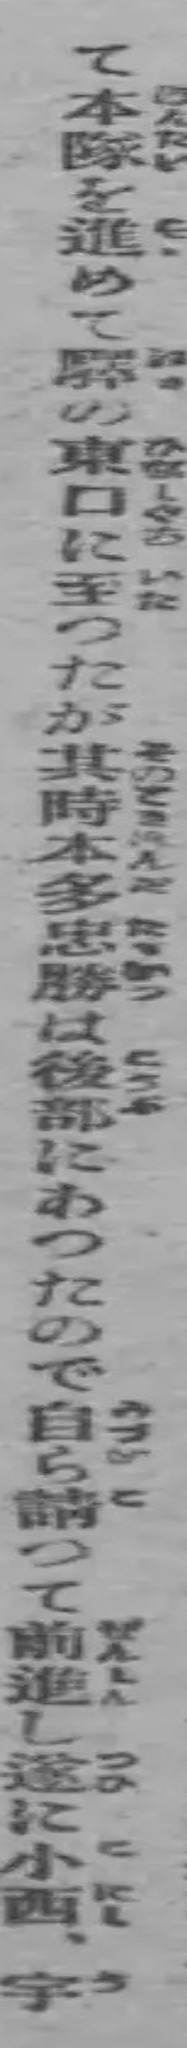て本隊を進めて駅の東口に至つたが其時本多忠勝は後部にあつたので自ら請つて前進し遂に小西、宇
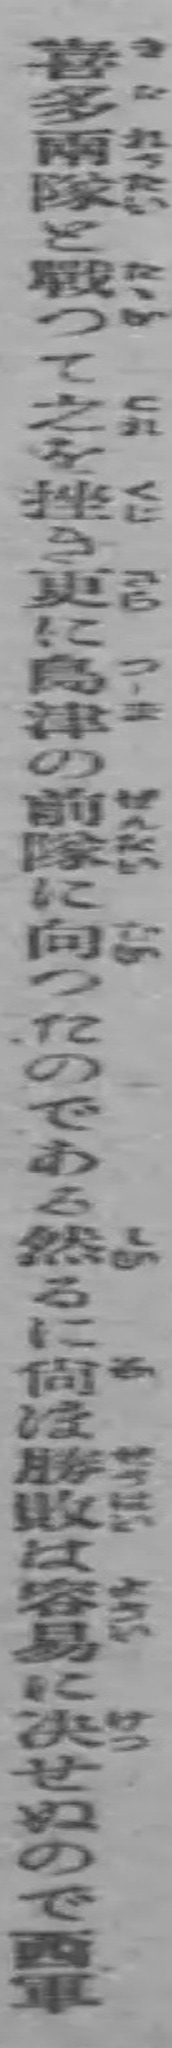喜多両隊と戦つて之を挫き更に島津の前隊に向つたのである然るに尚ほ勝敗は容易に決せぬので西軍
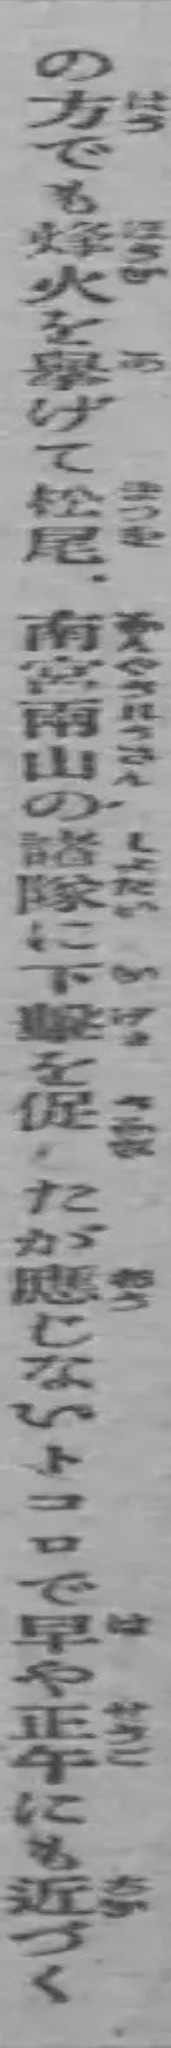の方でも烽火を挙げて松尾、南宮両山の諸隊に下撃を促したが応じないトコロで早や正午にも近づく
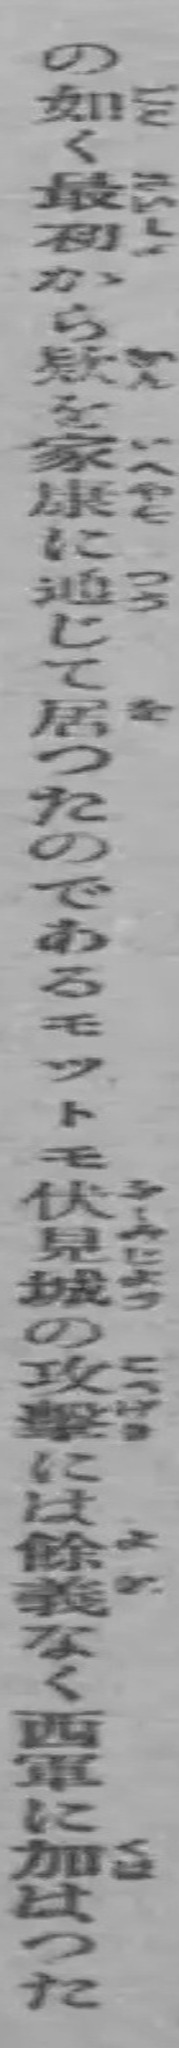の如く最初から欵を家康に通じて居つたのであるモツトモ伏見城の攻撃には余義なく西軍に加はつた
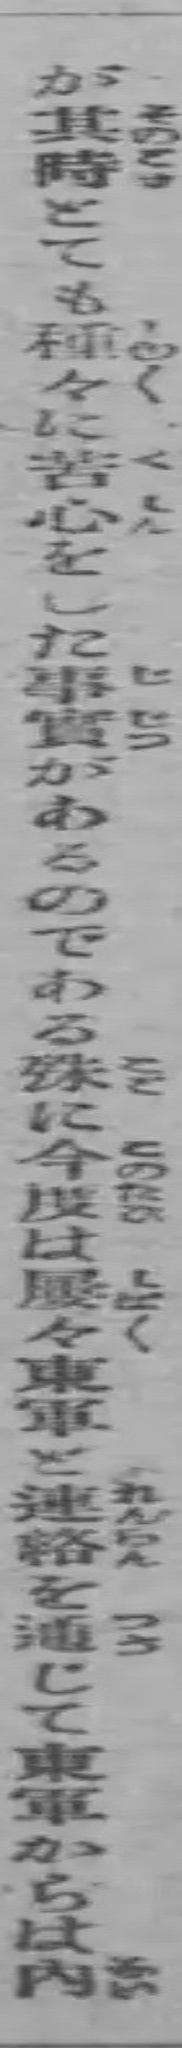が其時とても種々に苦心をした事実があるのである殊に今度は屡々東軍と連絡を通じて東軍からは内
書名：豊橋市史談
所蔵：国立国会図書館 National Diet Library, JAPAN
